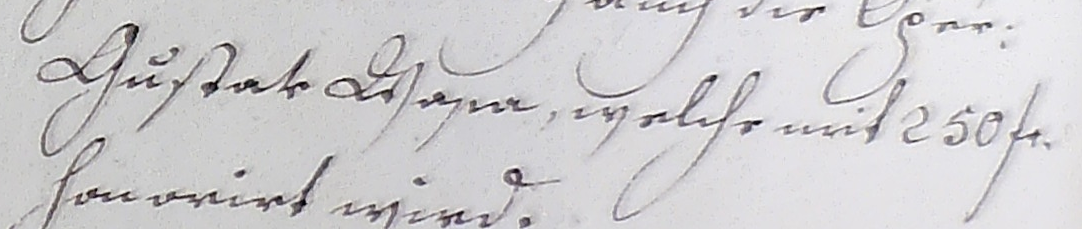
Gustav Wasa, welche mit 250fr.
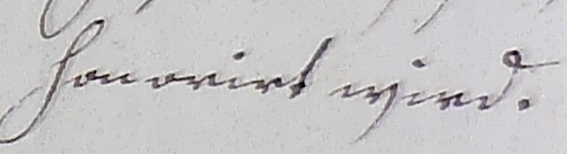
honorirt wird.
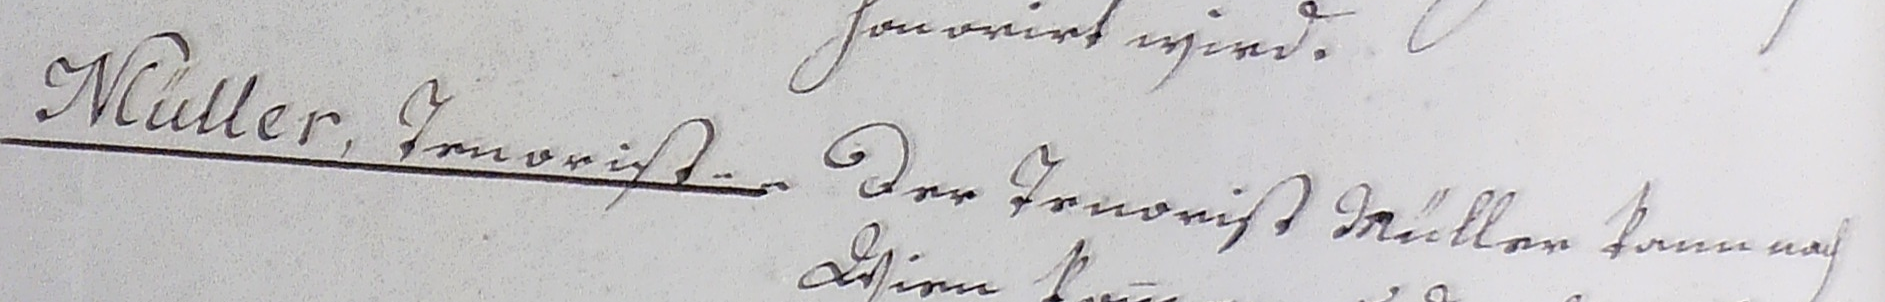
Müller, Tenorist .. .. Der Tenorist Müller kann nach
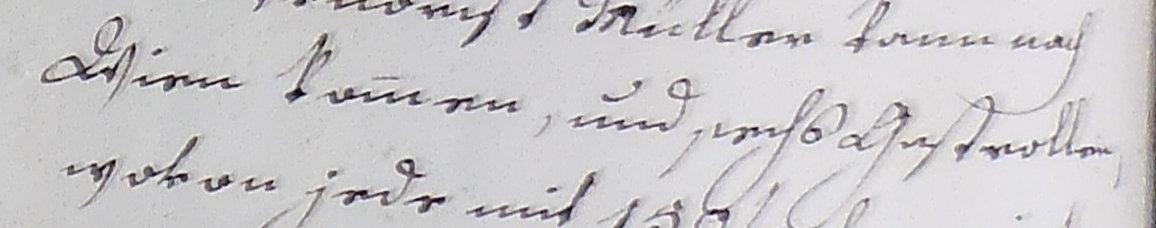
Wien kom̅en, und sechs Gastrollen,
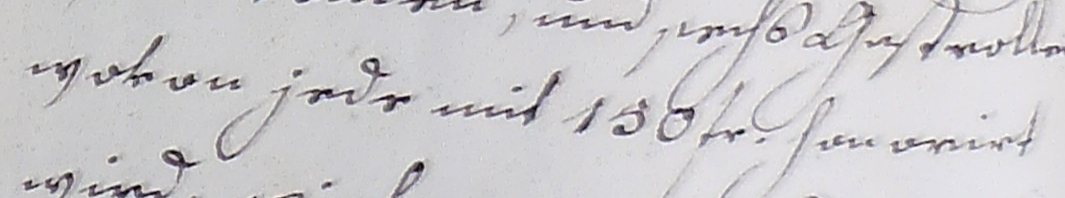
wovon jede mit 150fr. honorirt
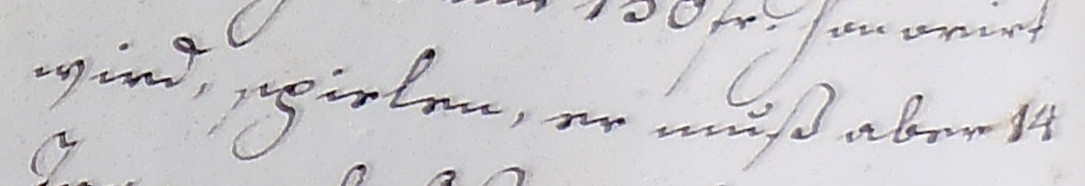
wird, spielen, er muß aber 14
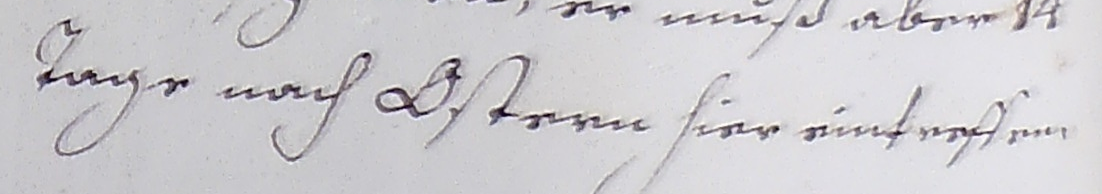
Tage nach Ostern hier eintreffen.
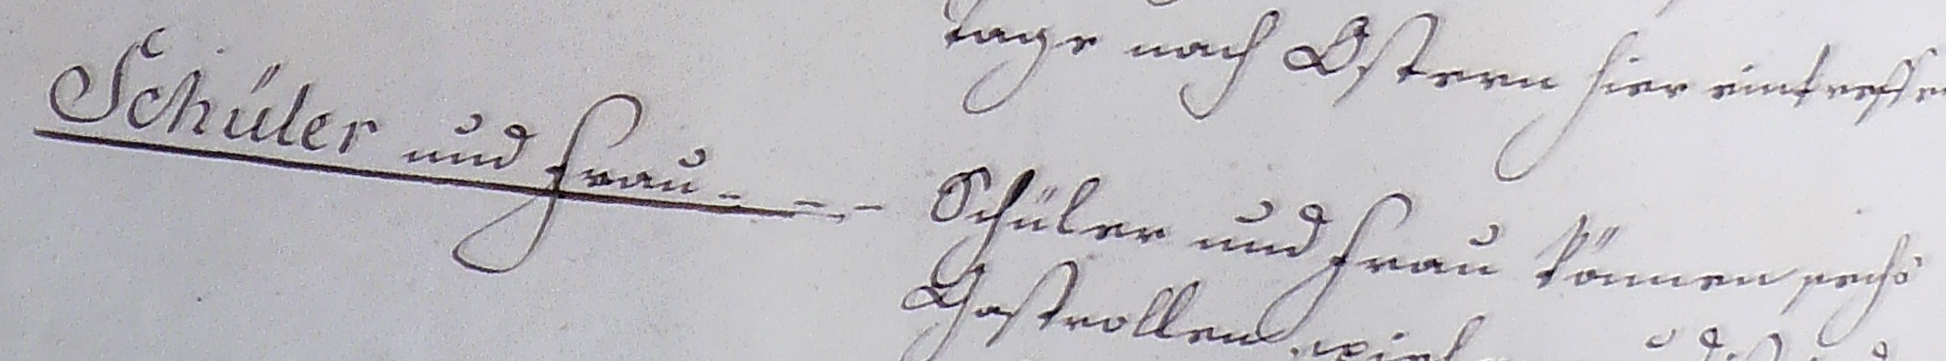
Schüler und Frau .. .. .. Schüler und Frau können sechs
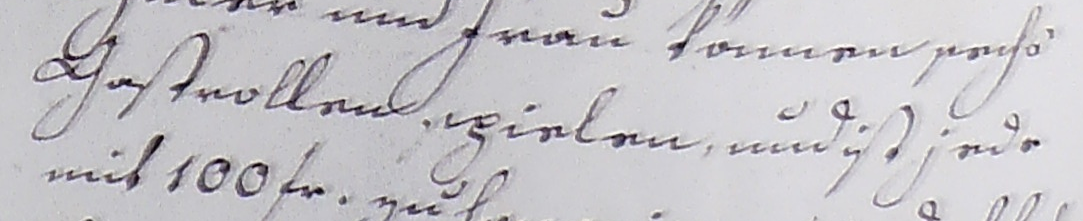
Gastrollen spielen, und ist jede
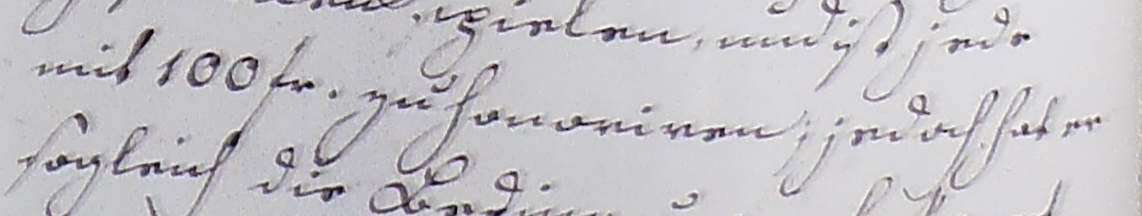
mit 100fr. zu honoriren; jedoch hat er
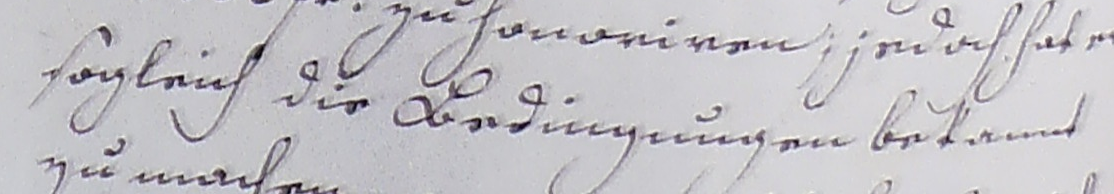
sogleich die Bedingungen bekannt
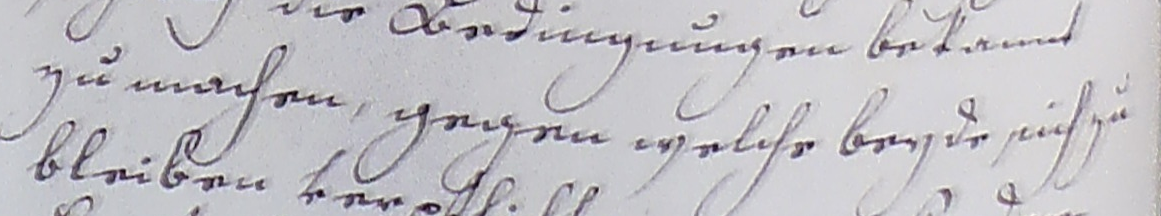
zu machen, gegen welche beyde sich zu
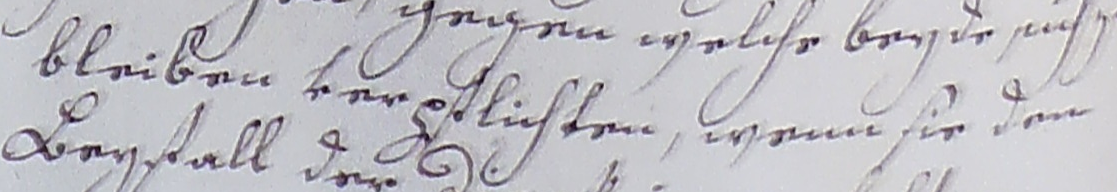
bleiben verpflichten, wenn sie den
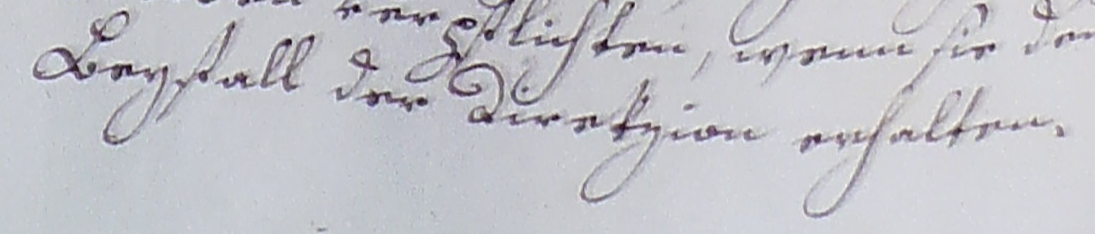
Beyfall der Direkzion erhalten.
